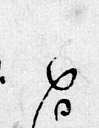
d.
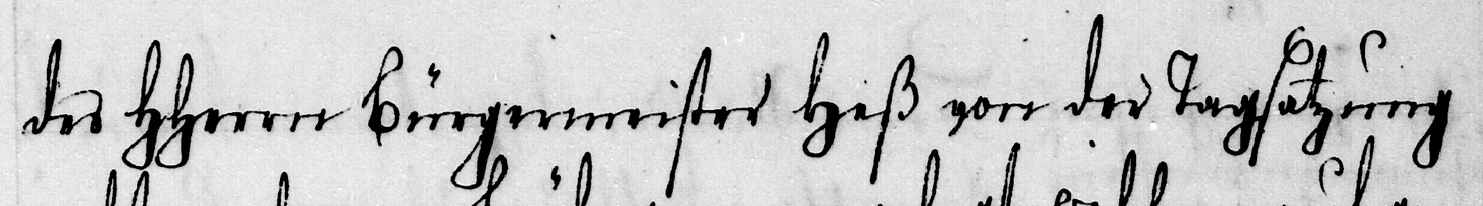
des HHerrn Bürgermeister Heß von der Tagsatzung
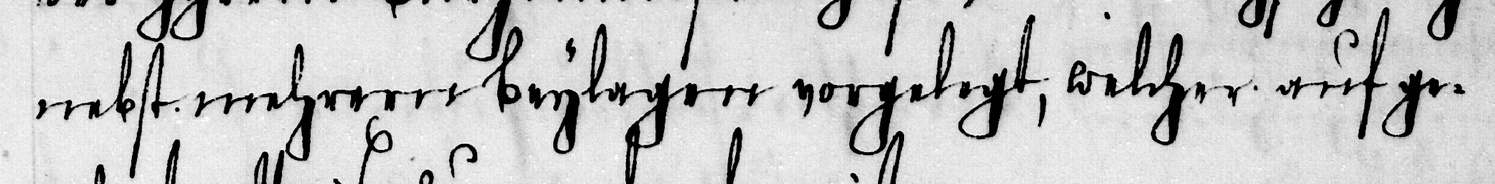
nebst mehrern Beylagen vorgelegt, welcher auf ge¬
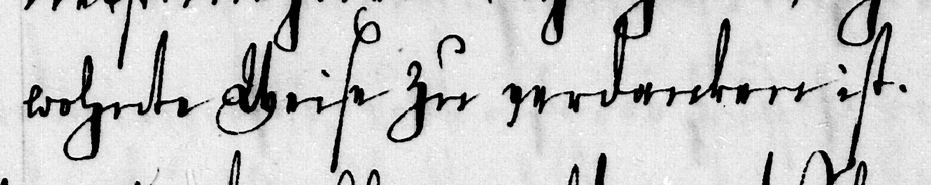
wohnte Weise zu verdanken ist.
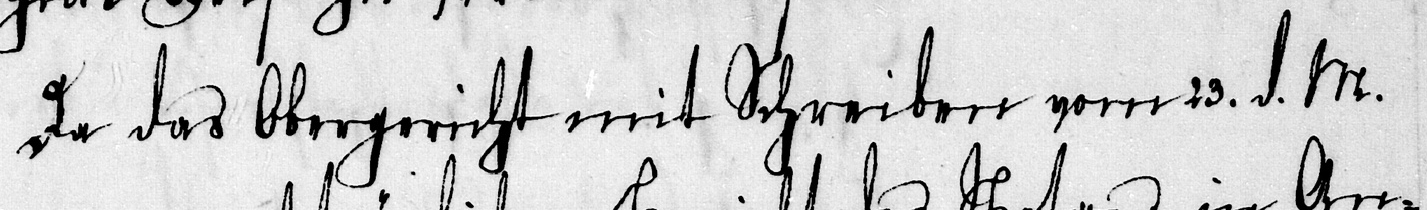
Da das Obergericht mit Schreiben vom 23. d. M.
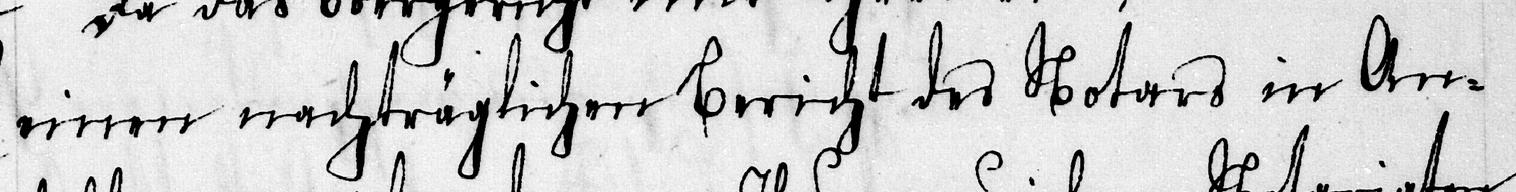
einen nachträglichen Bericht des Notars in An¬
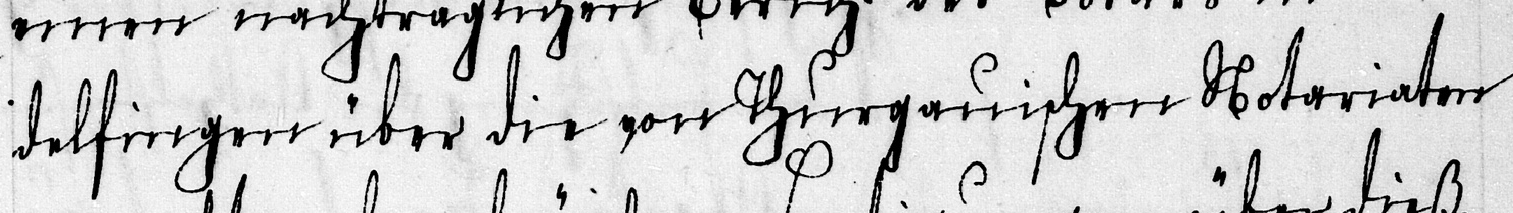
delfingen über die von thurgauischen Notariaten
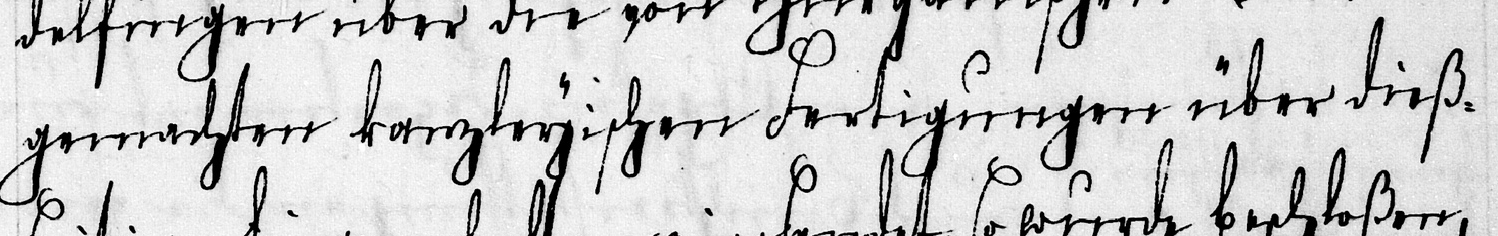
gemachten kanzleyischen Fertigungen über dieß¬
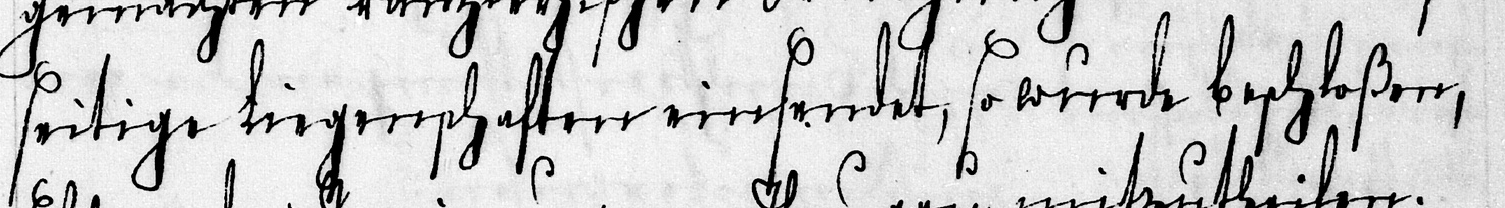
seitige Liegenschaften einsendet, so wurde beschloßen,
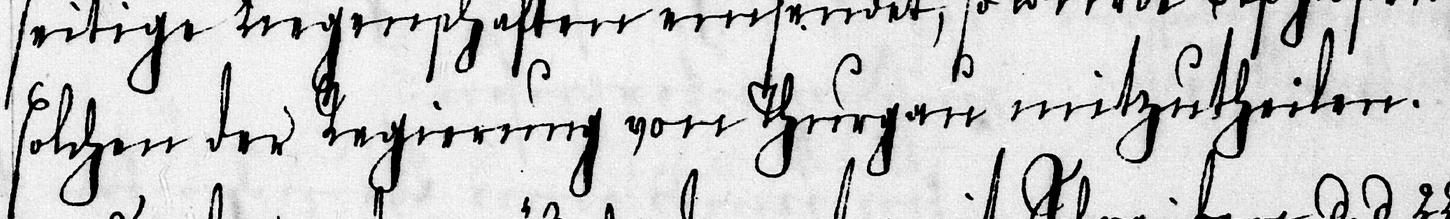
solchen der Regierung von Thurgau mitzutheilen.
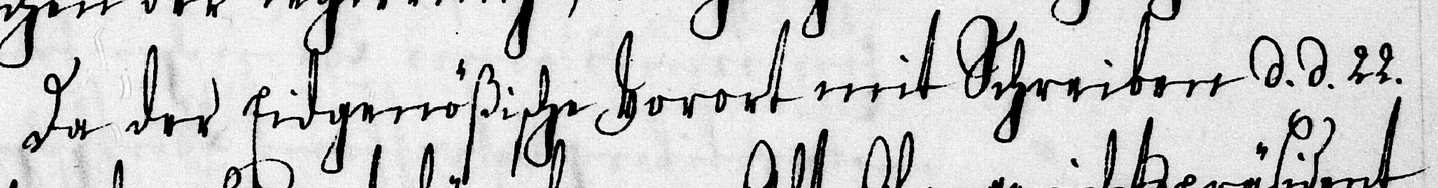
Da der Eidgenößische Vorort mit Schreiben d. d. 22.
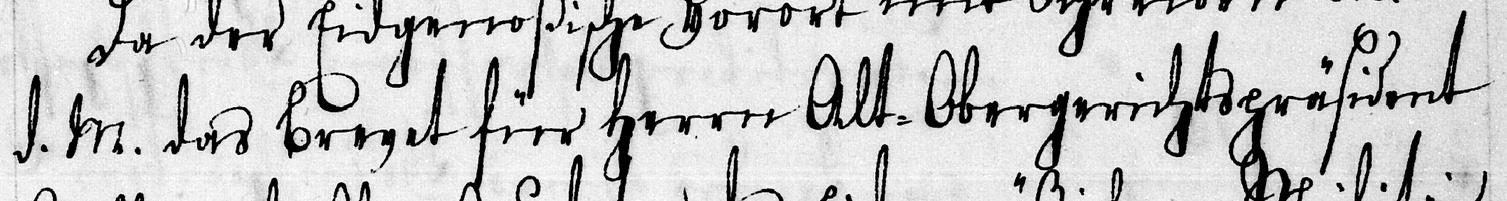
d. M. das Brevet für Herrn Alt-Obergerichtspräsident
